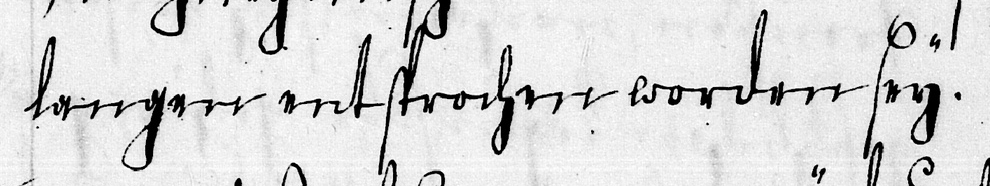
langen entsprochen worden sey.
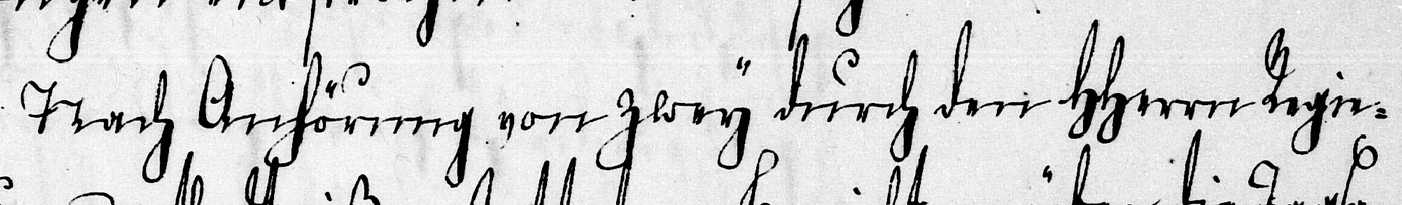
Nach Anhörung von zwey durch den HHerrn Regie¬
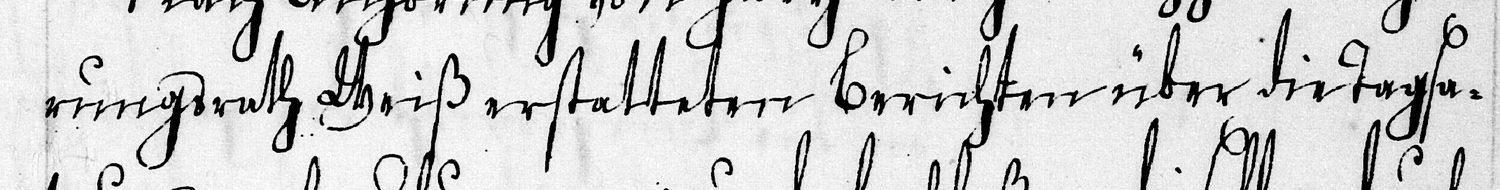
rungsrath Weiß erstatteten Berichten über die Tagsa¬
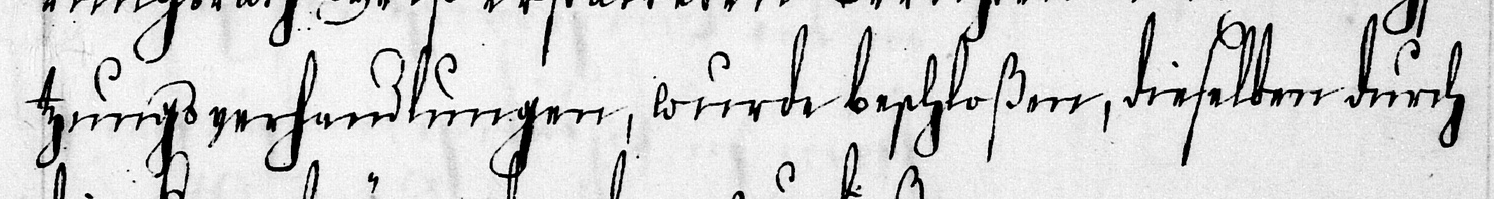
tzungsverhandlungen, wurde beschloßen, dieselben durch
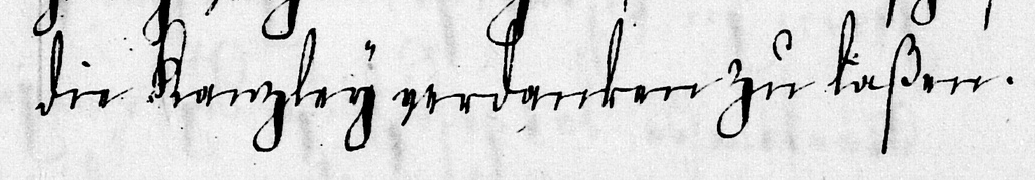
die Kanzley verdanken zu laßen.
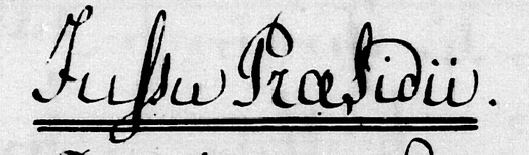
Acten Kenntniß zu
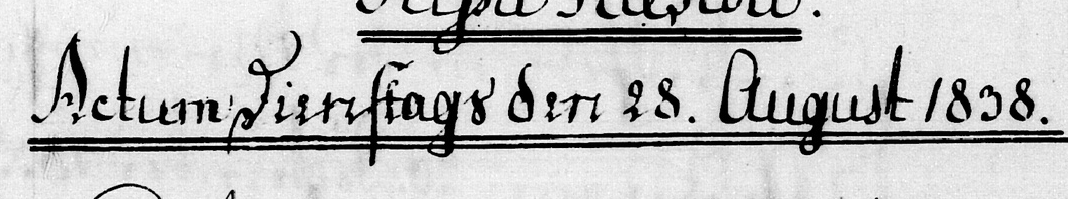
Actum Dienstags den 28. August 1838.
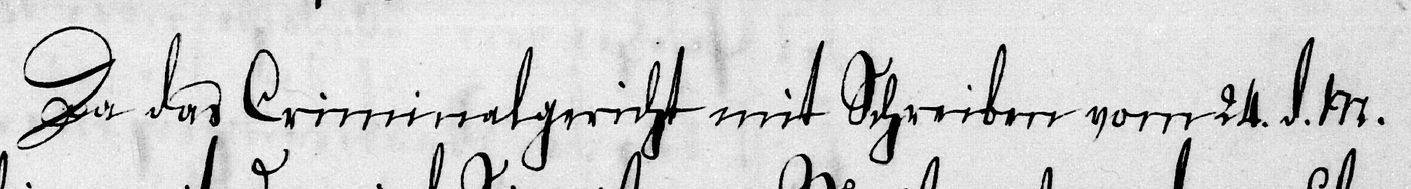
Da das Criminalgericht mit Schreiben vom 24. d. M.
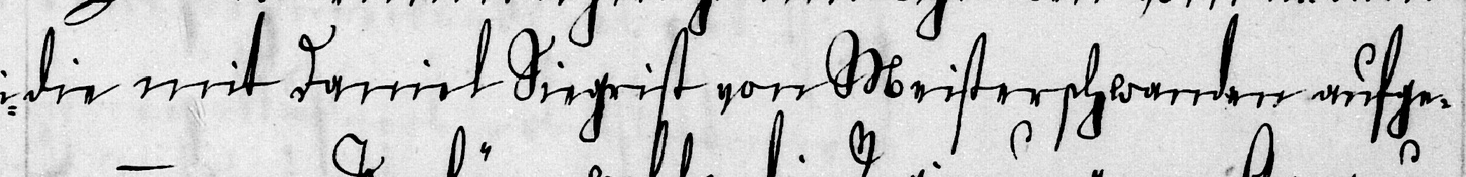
die mit Daniel Siegrist von Meisterschwanden aufge¬
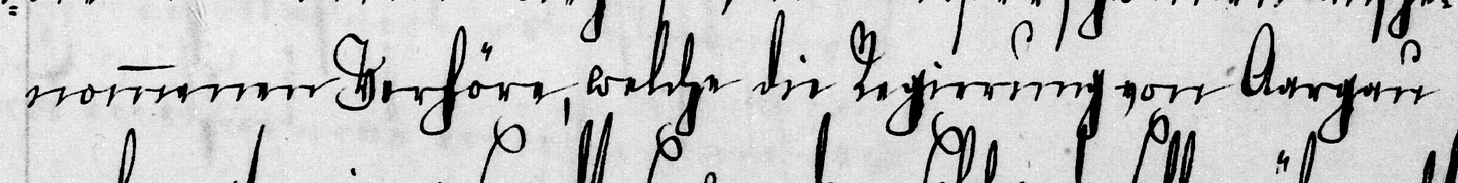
nommenen Verhöre, welche die Regierung von Aargau
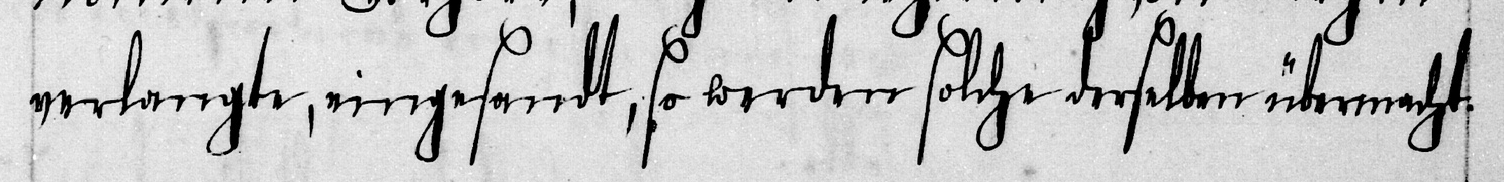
verlangte, eingesandt, so werden solche derselben übermacht.
